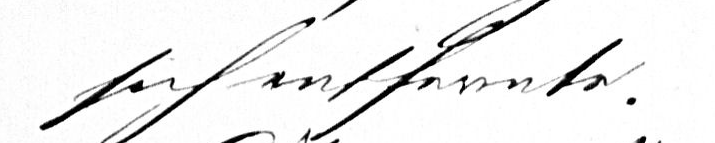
sich entfernte.
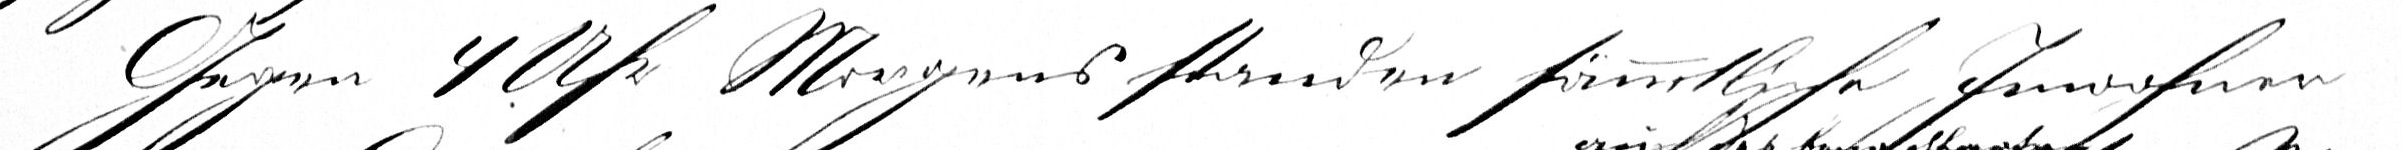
Gegen 4 Uhr Morgens standen sämmtliche Inwohner
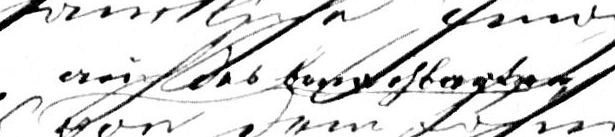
auf des benachbarten
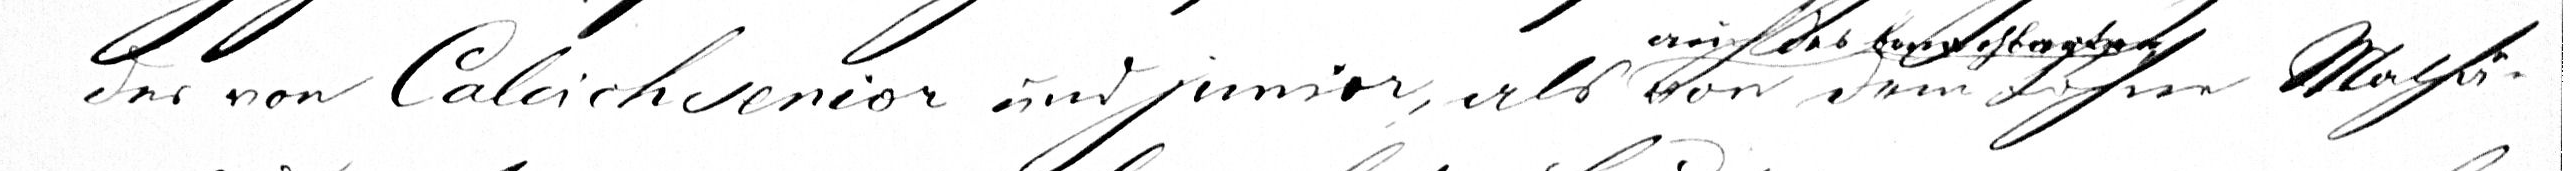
des von Calcich senior und junior, als von dem Sohne Mathä¬
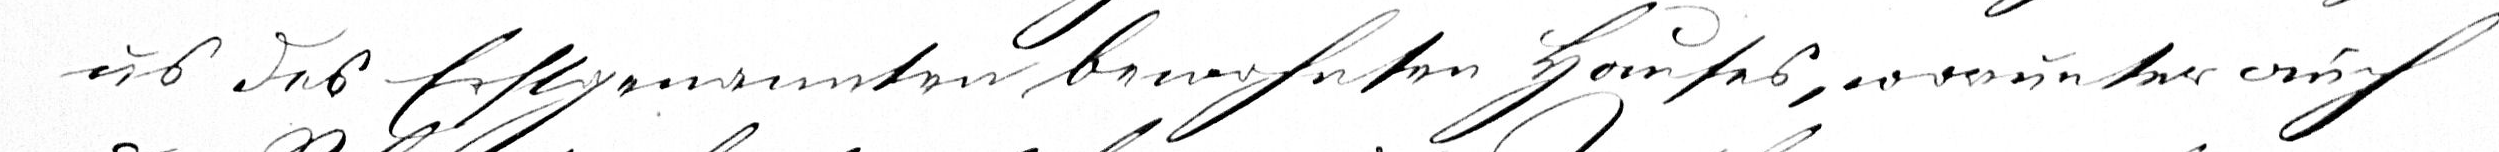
us des Erstgenannten bewohnten Hauses, worunter auch
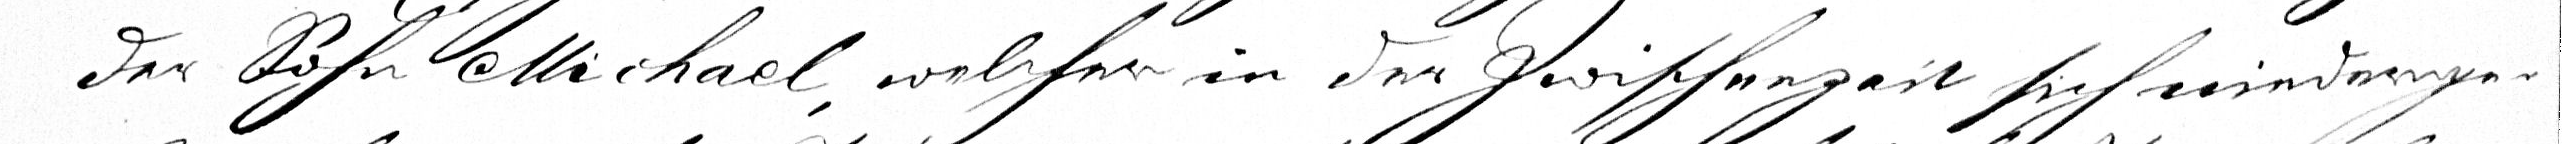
der Sohn Michael, welcher in der Zwischenzeit sich niederge¬
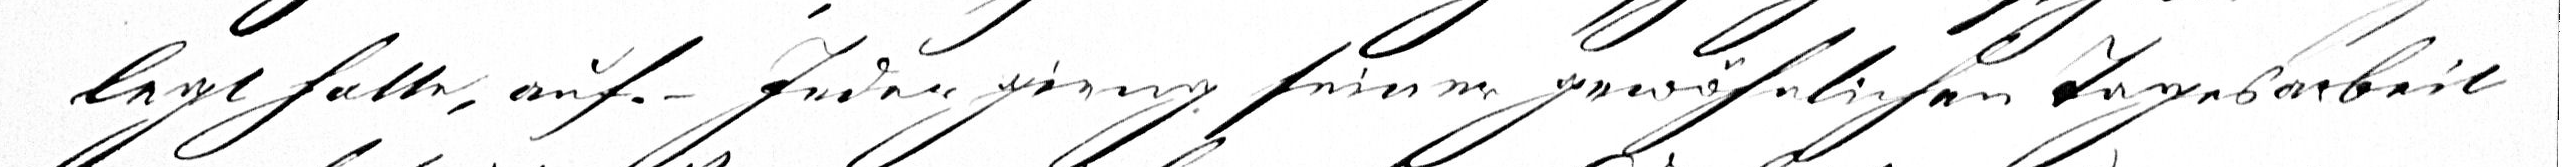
legt hatte, auf.- Jeden gieng seiner gewöhnlichen Tagesarbeit
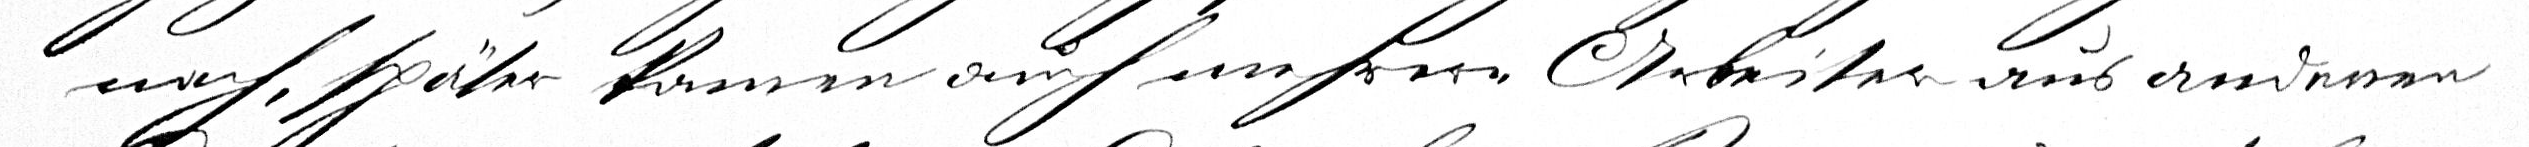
nach, später kamen auch mehrere Arbeiter aus anderen
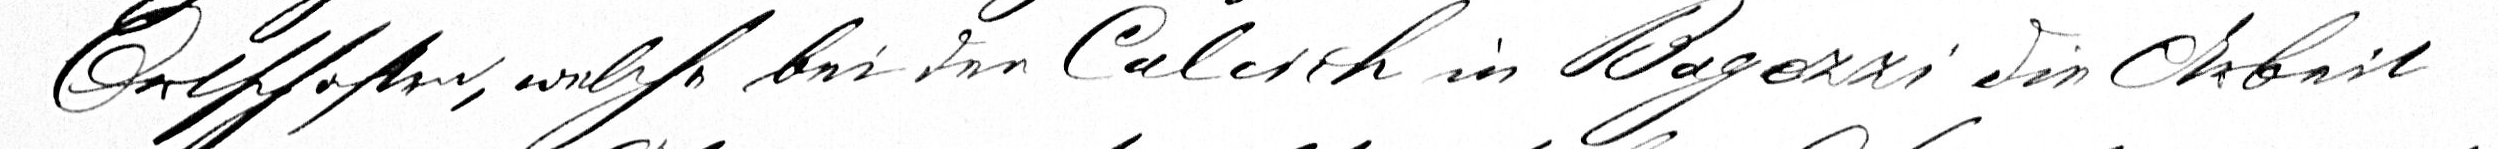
Ortschaften, welche bei den Calcich in Bagezzi die Arbeit
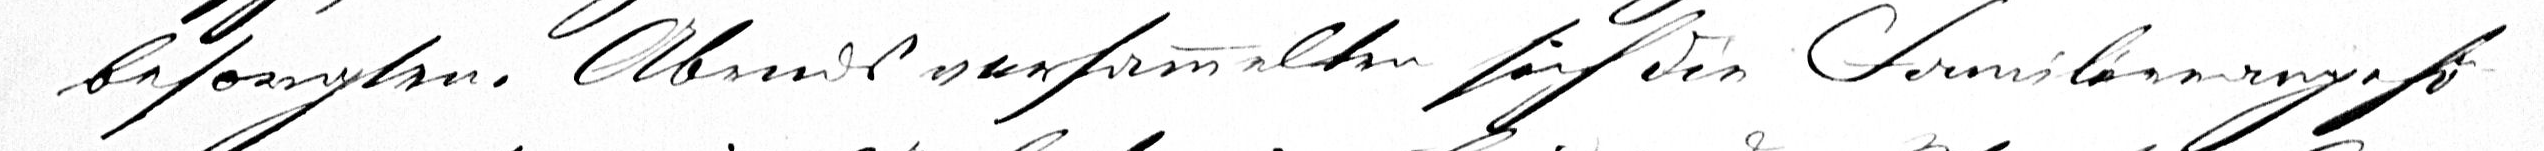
besorgten. Abends versammelten sich die Familienangehö¬
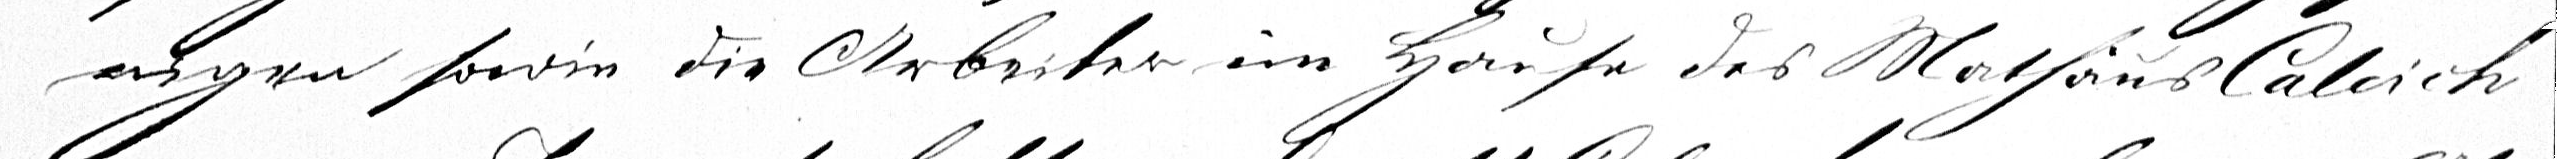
rigen sowie die Arbeiter im Hause des Mathäus Calcich
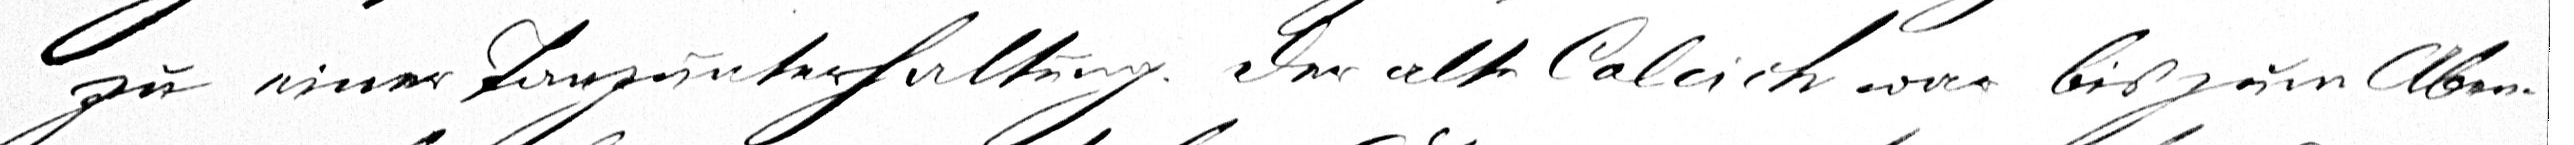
zu einer Tanzunterhaltung. Der alte Calcich war bis zum Aben¬
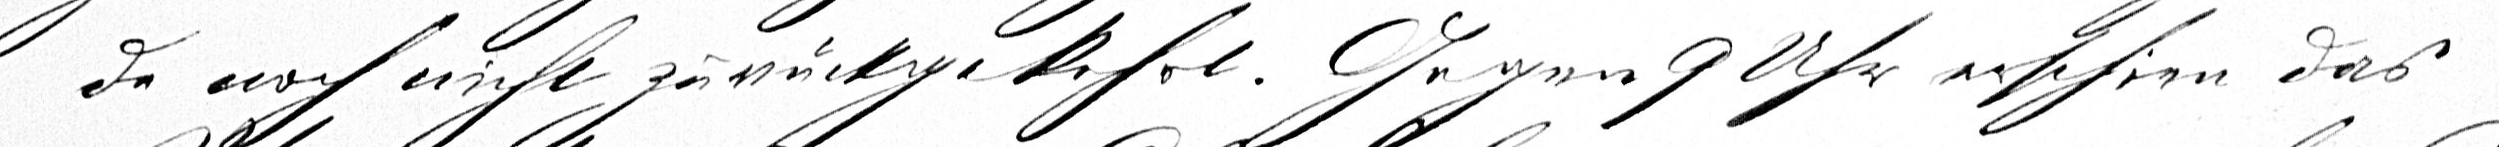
de noch nicht zurückgekehrt. Gegen 9 Uhr erschien das
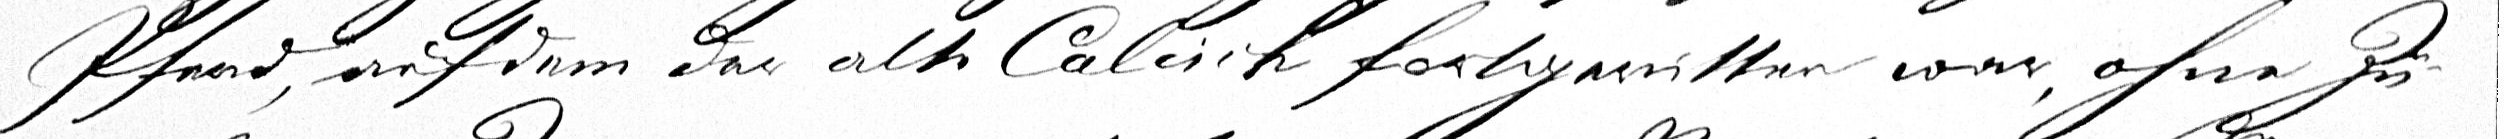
Pfand, auf dem der alte Calcich fortgeritten war, ohne Zü¬
